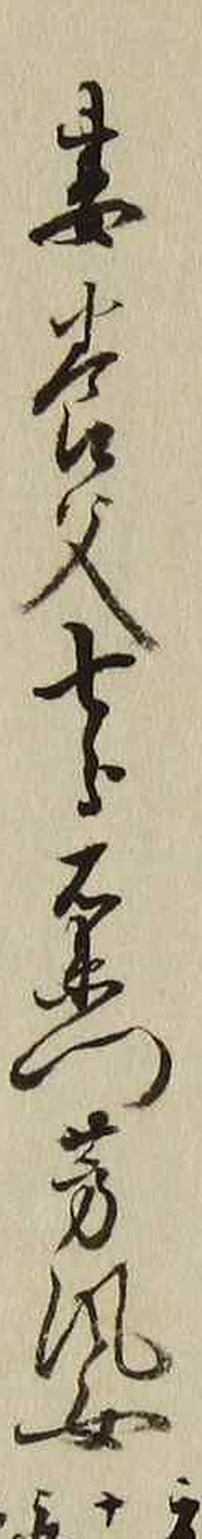女養子七郎右衛門芳風妻
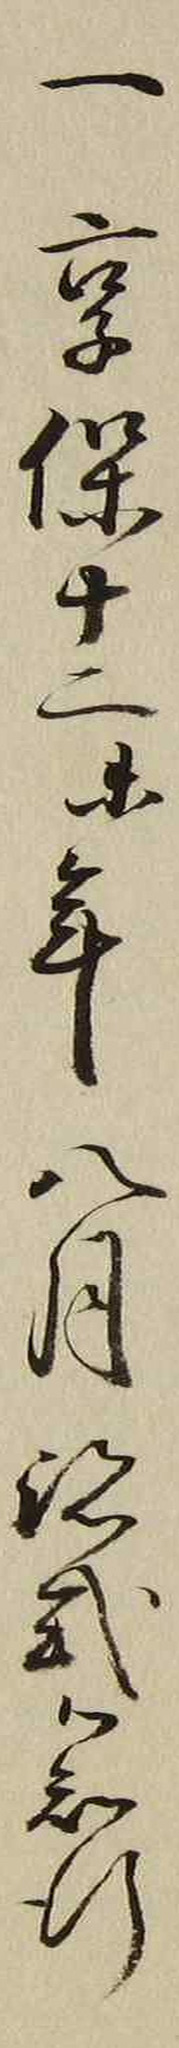一享保十二未年八月跡弐御知行
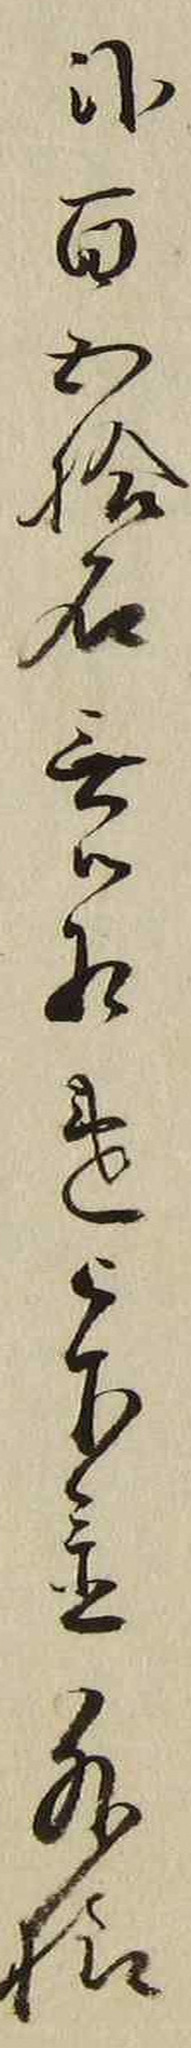弐百五拾石無御相違被下置外様
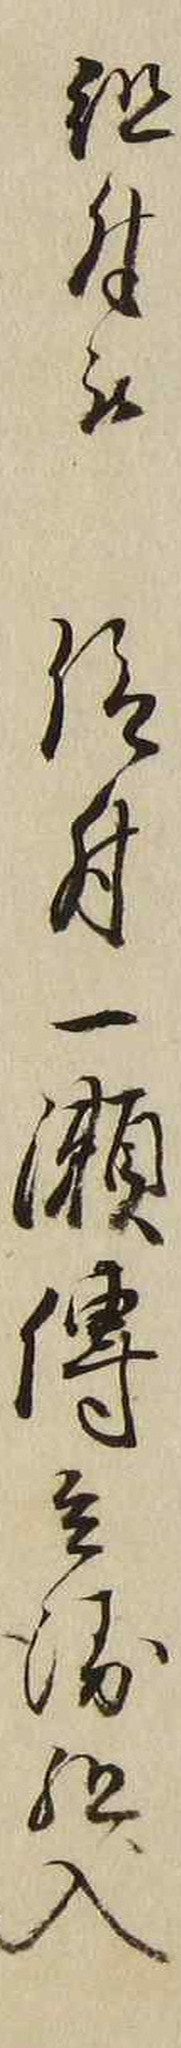組付被仰付一瀬伝兵衛組入

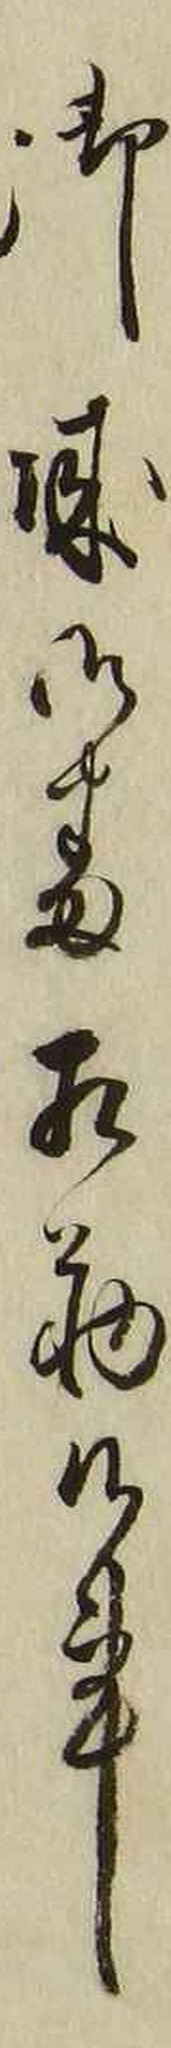御城御番相勤候事
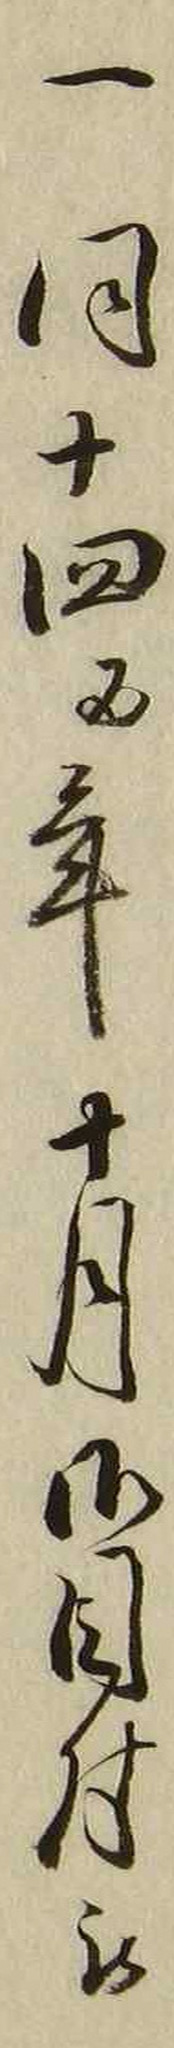一同十四酉年十月御目付被
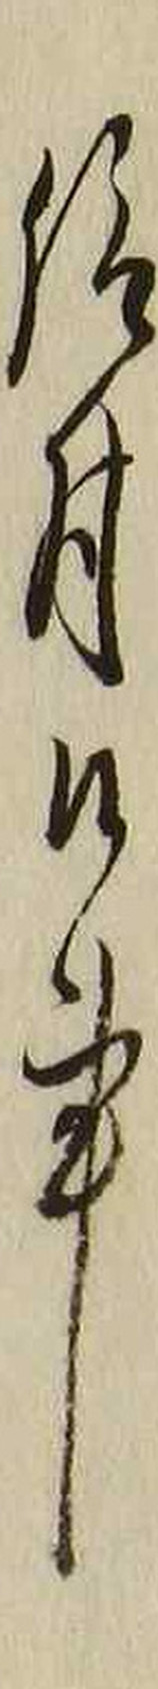仰付候事
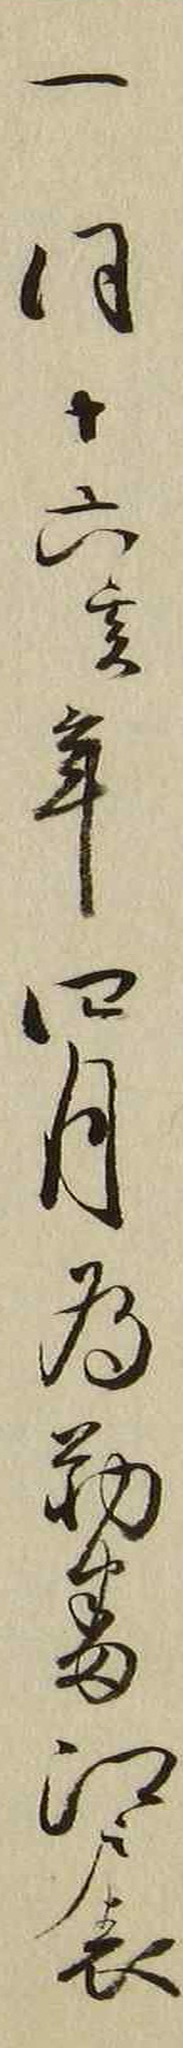一同十六亥年四月為勤番江戸表
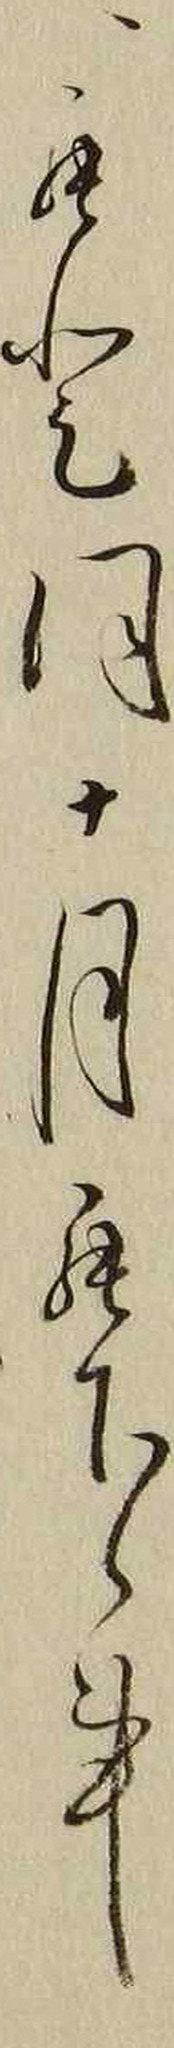へ罷登同十月罷下候事
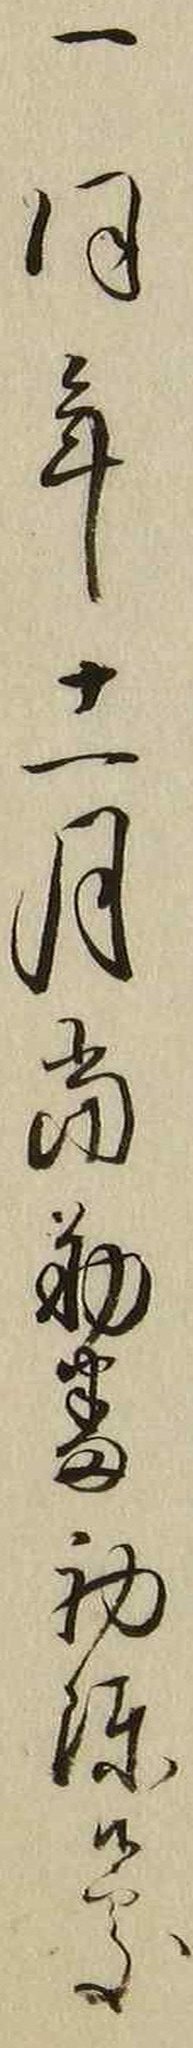一同年十一月当勤番初陣候処
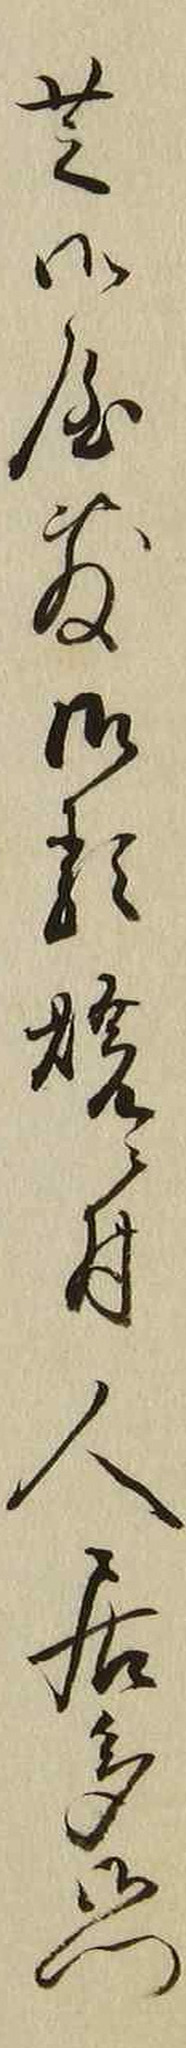芝御屋敷御類焼ニ付人居多御門
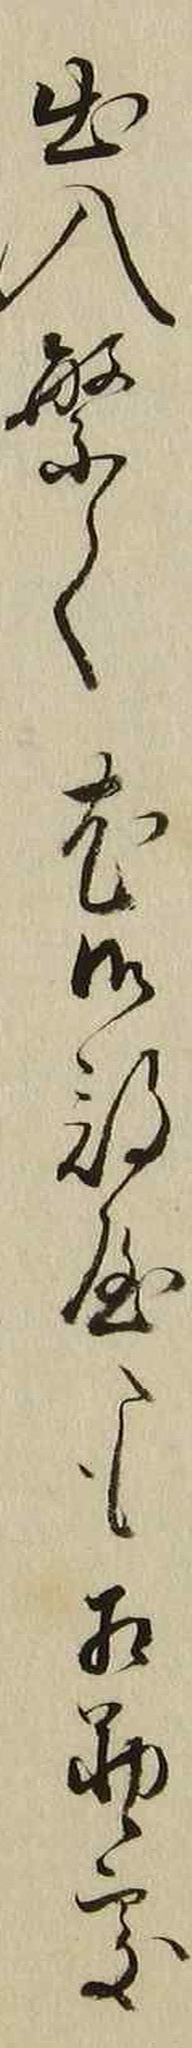出入繁く尤御部屋へも相勤候処
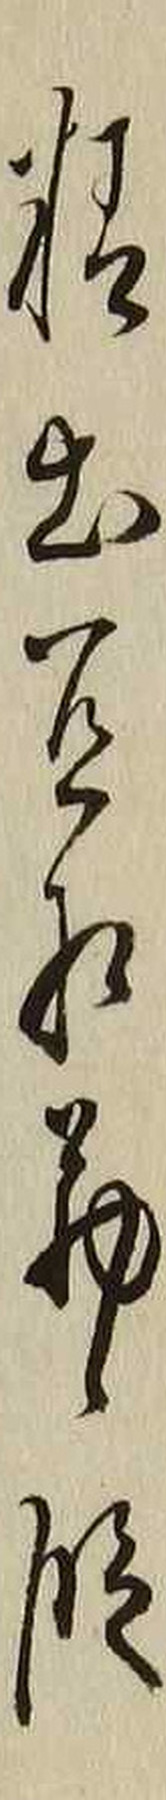精出宜相勤候段
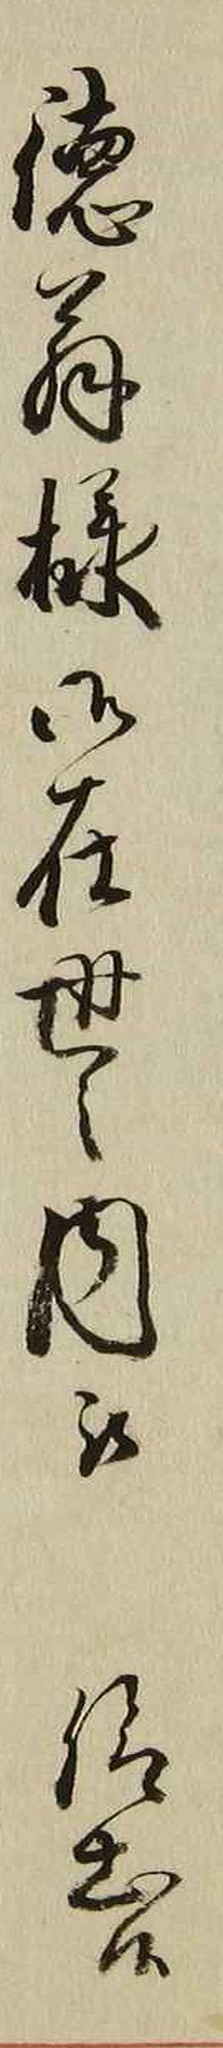徳翁様御在世之内被仰出候
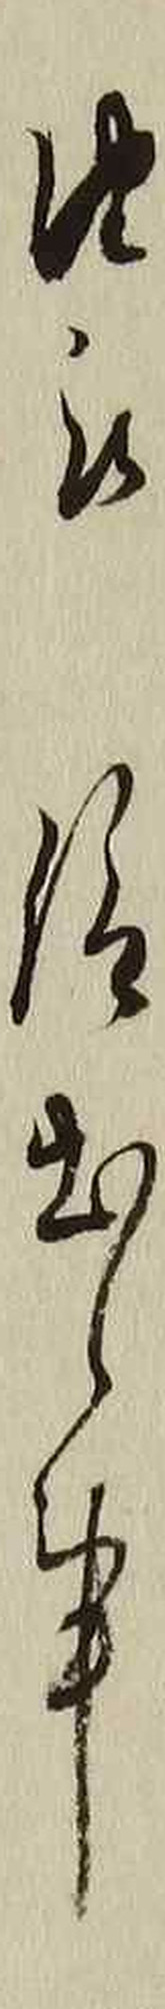由被仰出候事
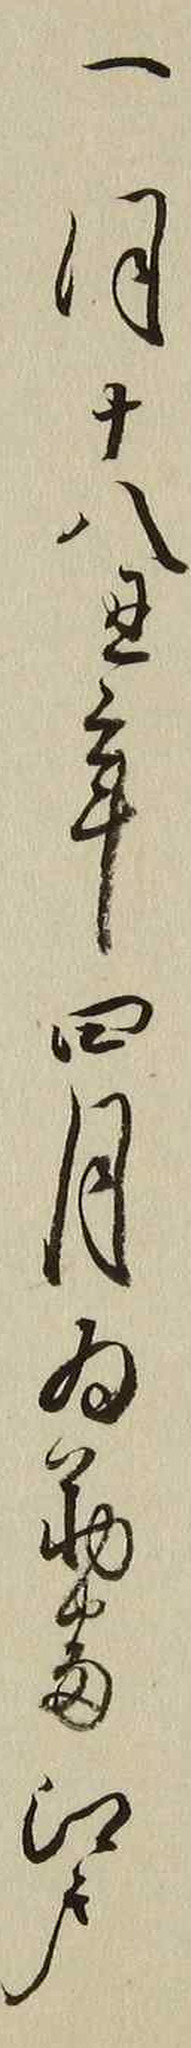一同十八丑年四月為勤番江戸
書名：諸士系譜　巻之1　い之部1
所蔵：会津若松市立会津図書館
